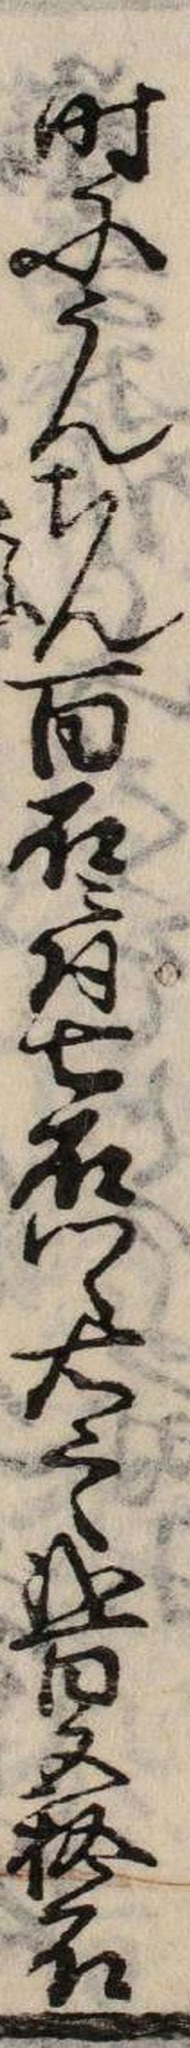時にうんちん百石に付七石つづ右之弐百五拾石
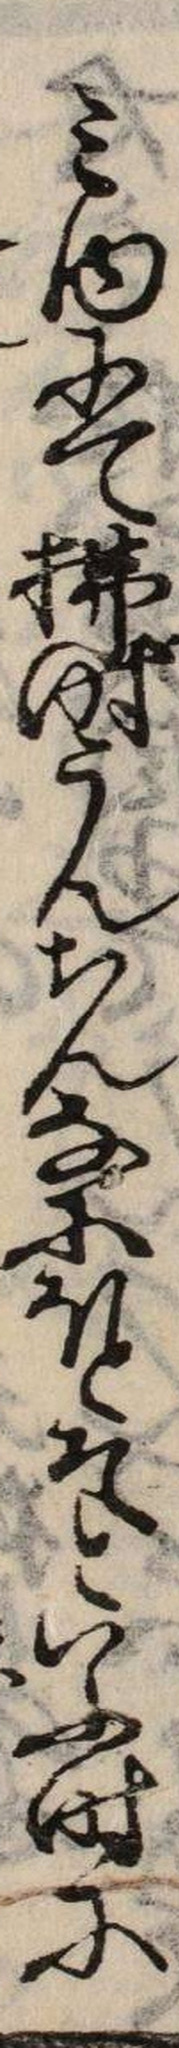みゆにて拂時うんちんなにほとそといふ時に
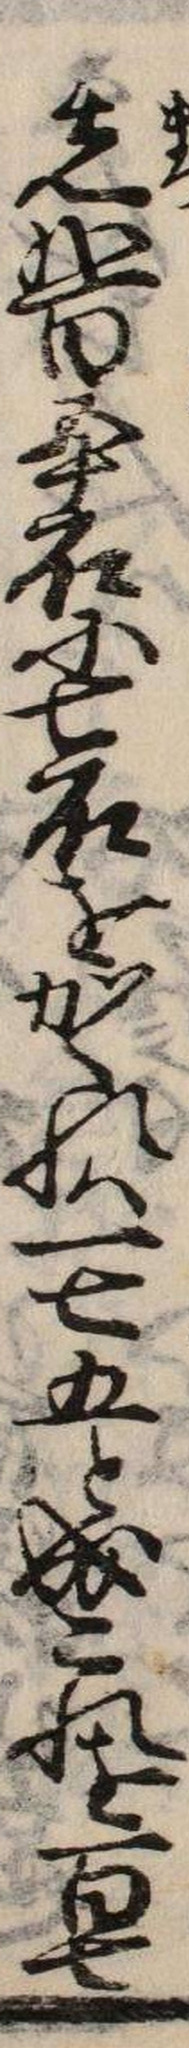先弐百五十石に七石をかくれは一七五と成これを百七
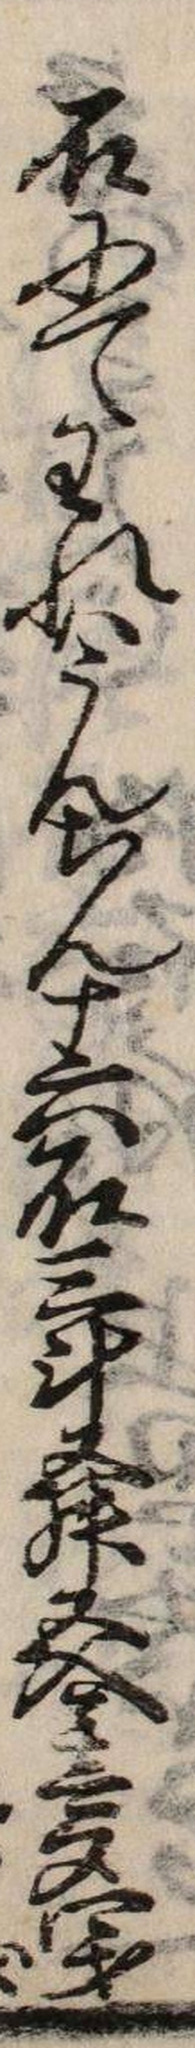石にてわれはうんちん十六石三斗五升五合三勺四才と成
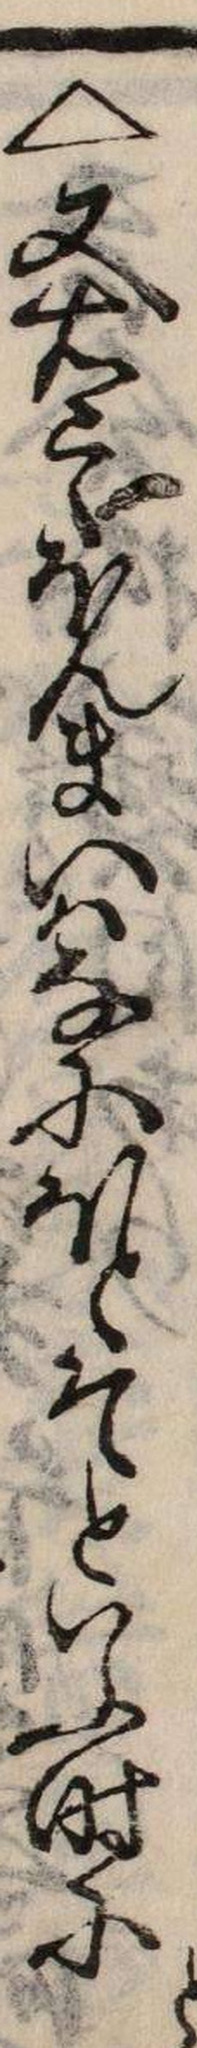△又右之ほんまいはなにほとそといふ時に
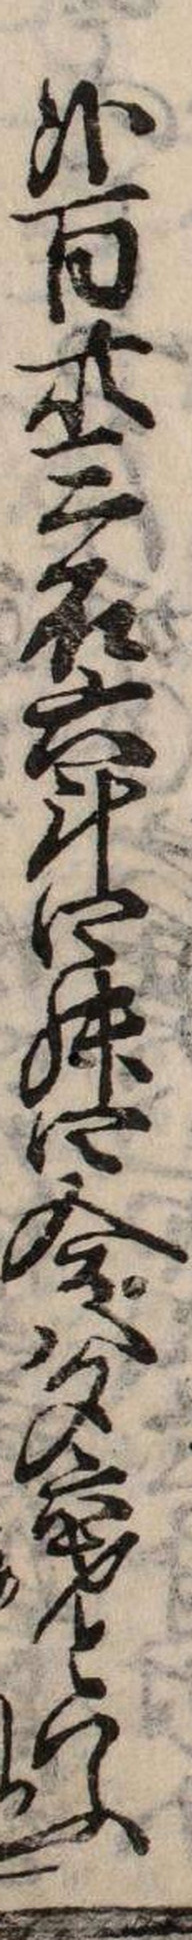弐百卅三石六斗四升四合八勺六才といふ
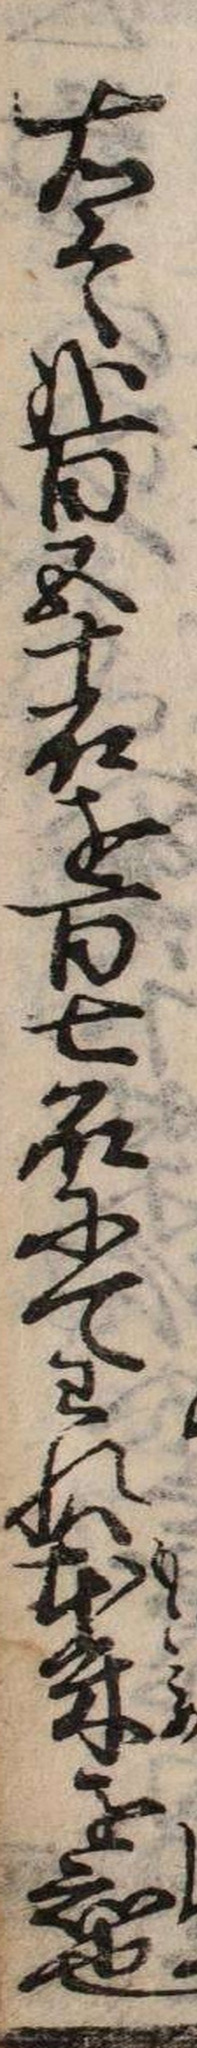右之弐百五十石を百七石にてわれは本米を知也

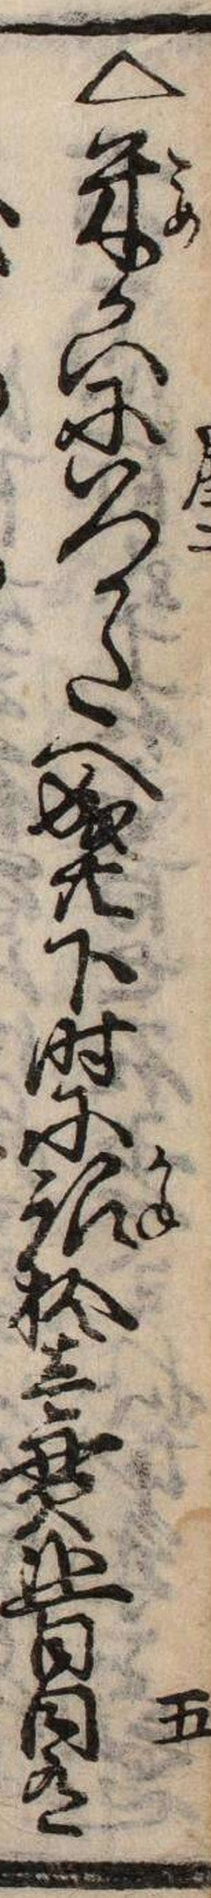△米かいにいつかたへ成共下時に銀拾壱貫弐百目有
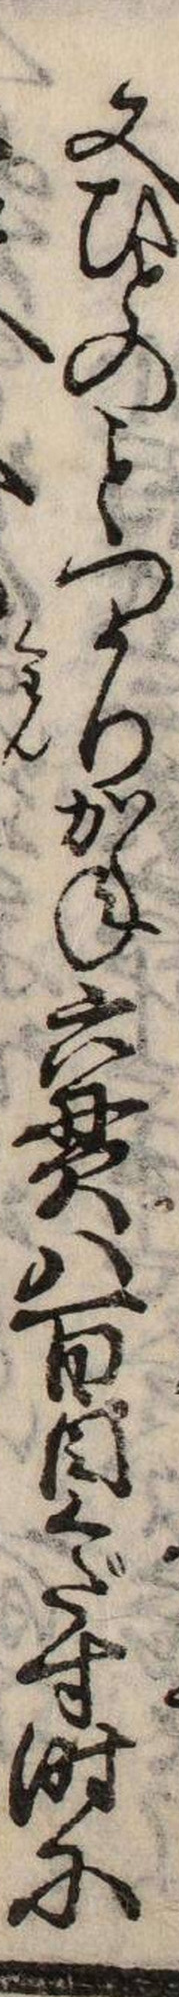又ひとのことつかりかね六貫八百目くだす時に
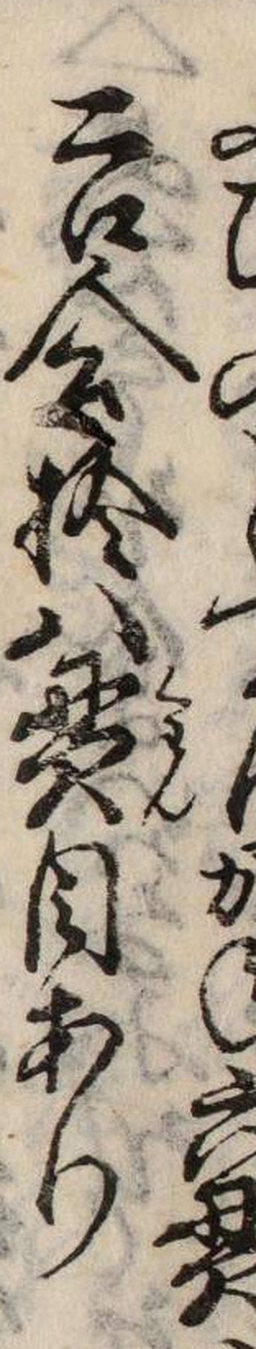二口合拾八貫目あり
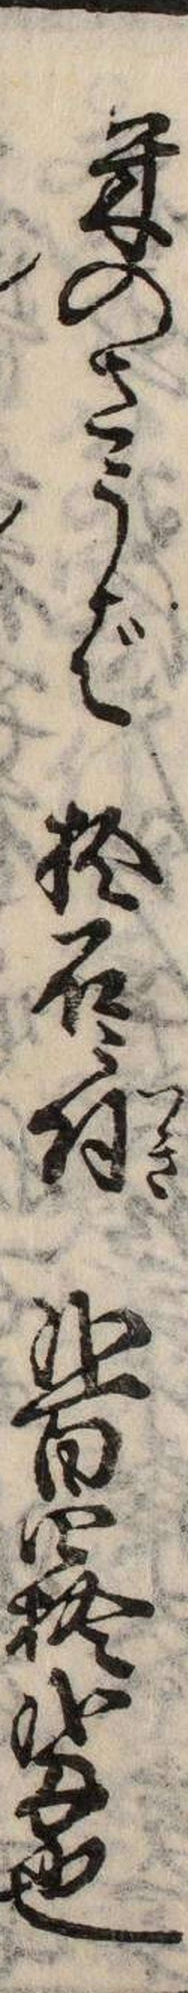米のさうば拾石に付弐百四拾弐両也
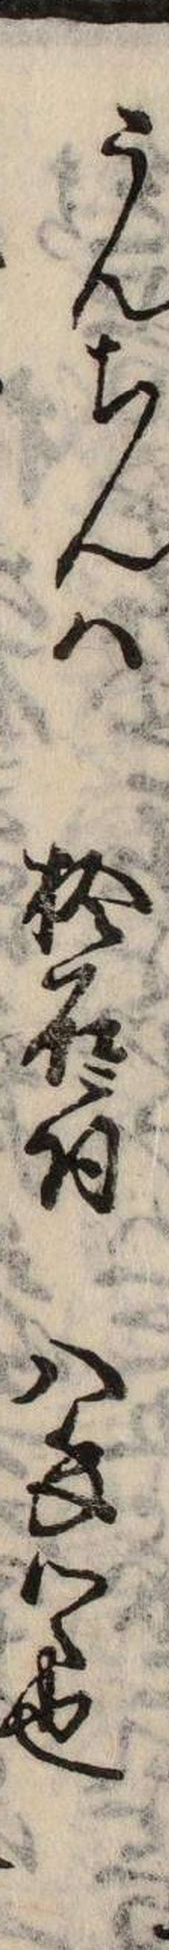うんちんは拾石に付八匁と也
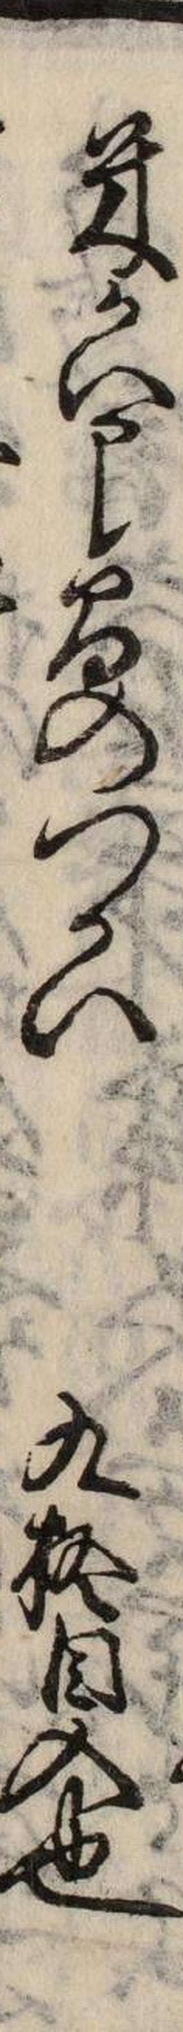米かい申候間のつかい九拾目入也
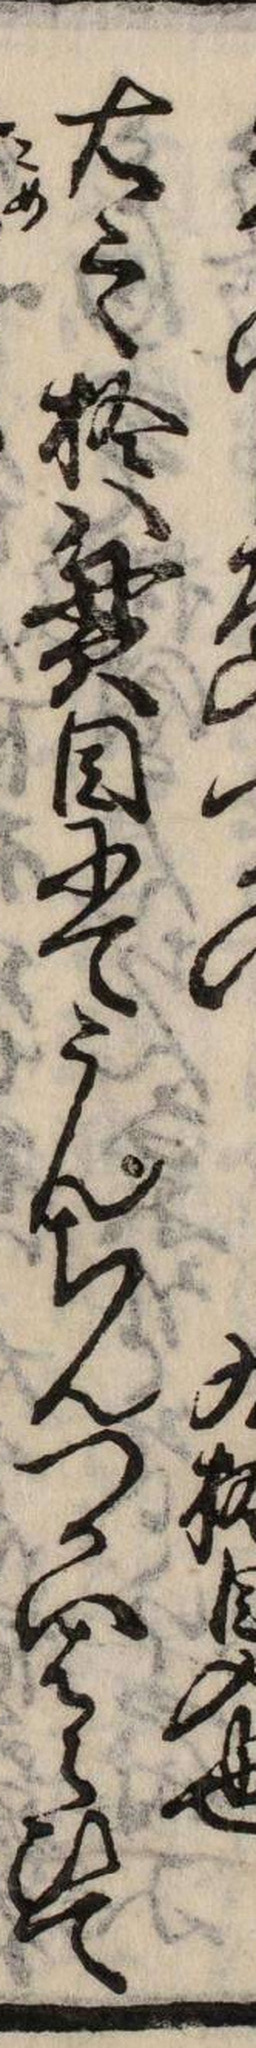右之拾八貫目にてうんちんつかいはらひて
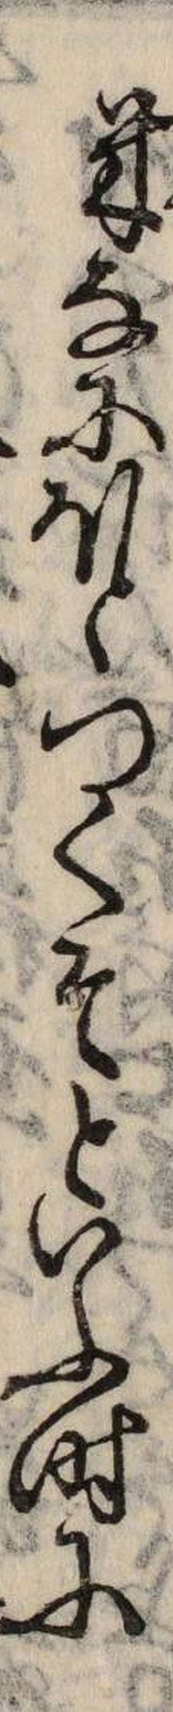米なにほとつくそといふ時に
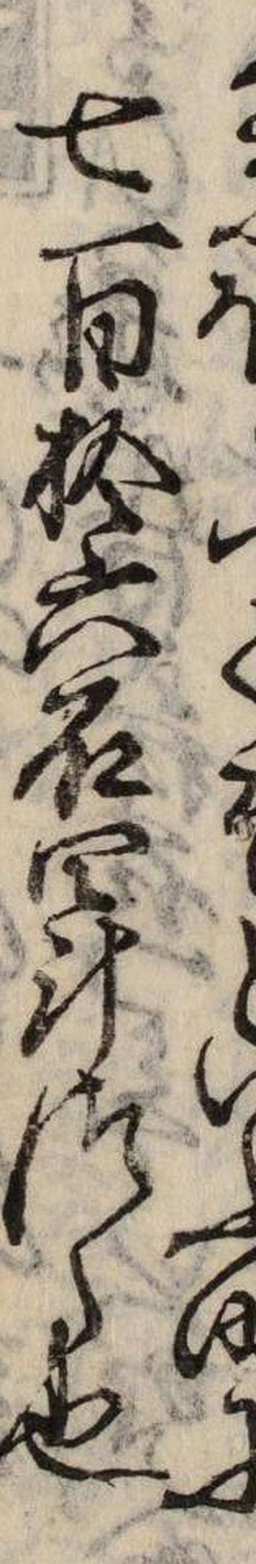七百拾六石四斗つづ也
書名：塵劫記（寛永11年自跋、京都府立京都学・歴彩館追貴8）
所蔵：京都府立京都学・歴彩館 国文学研究資料館
